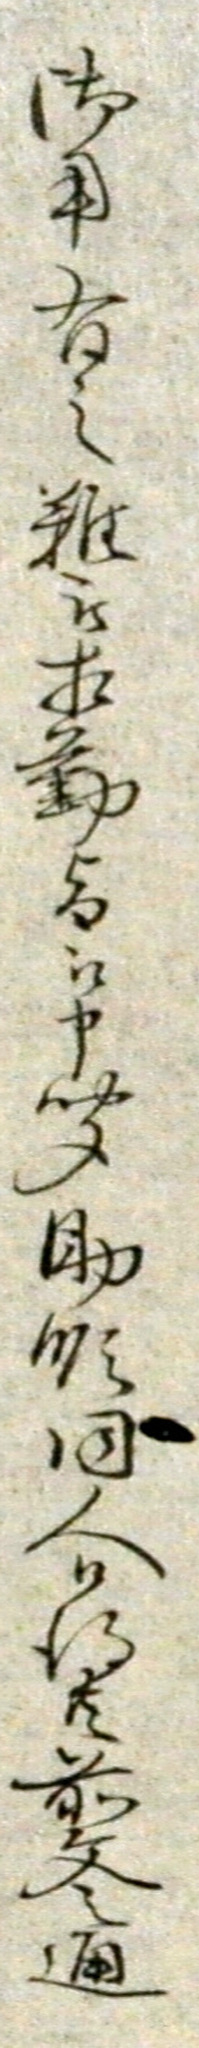番攝津守御用有之難被相勤旨被申聞助順同人候得共前文
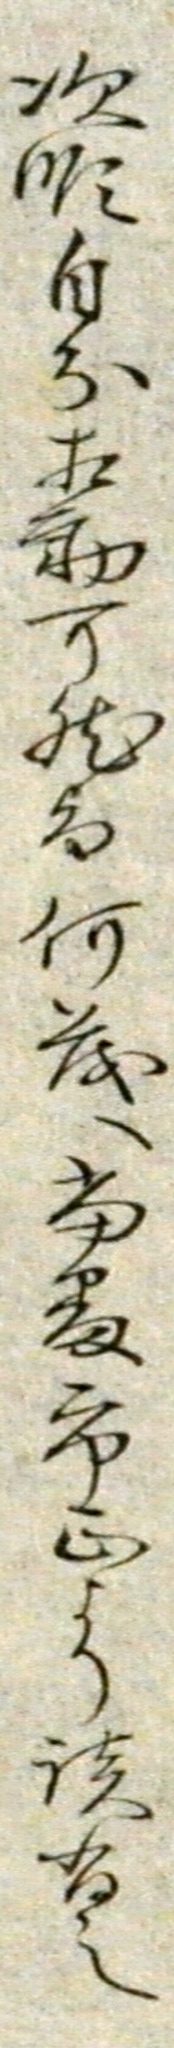之通次順自分相勤可然何茂へ当番市正より談有之
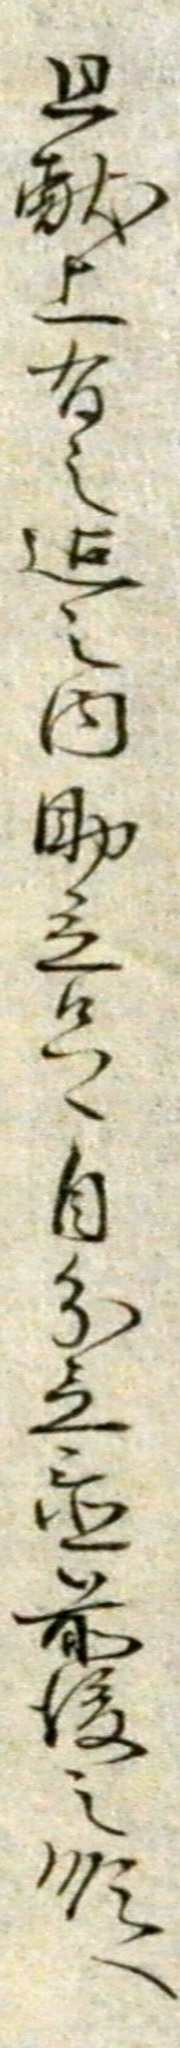且献上有之迠之内助立候ハヽ自分立置前後之順へ
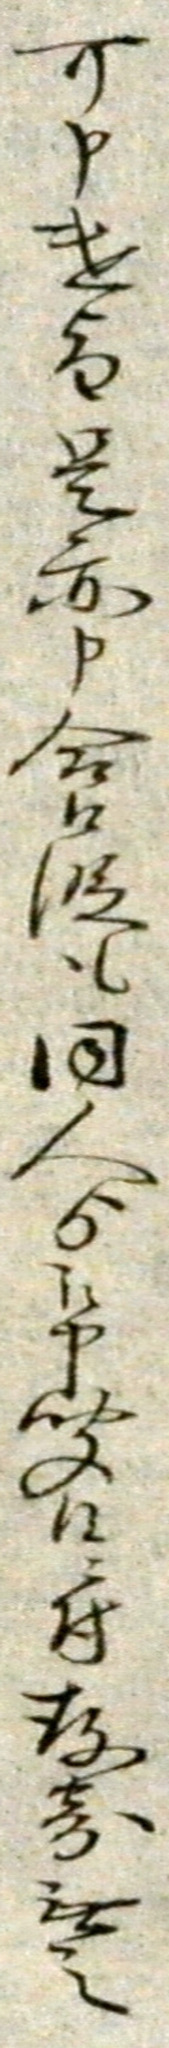可申遣旨是亦申合候段も同人ゟ被申聞候二付存寄無之
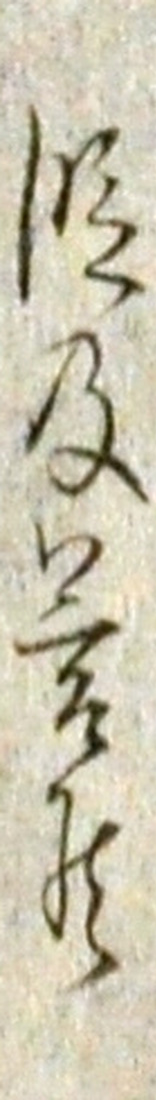段及答候
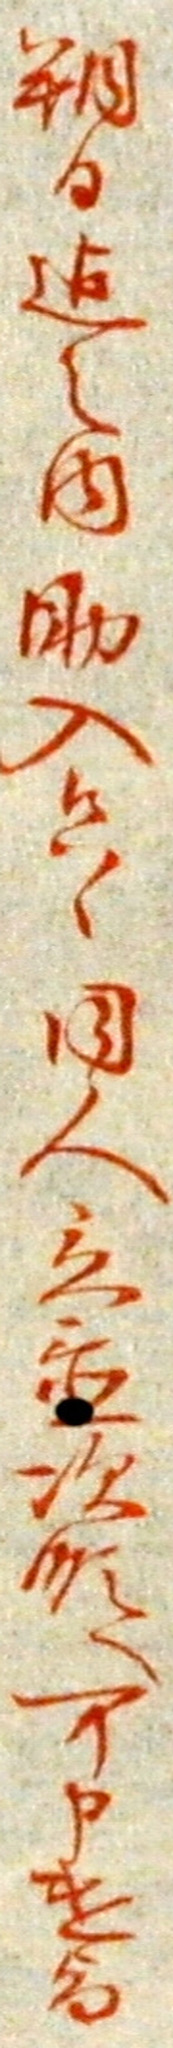朔日迄之内助入候はゝ同人立置次順へ可申遣旨
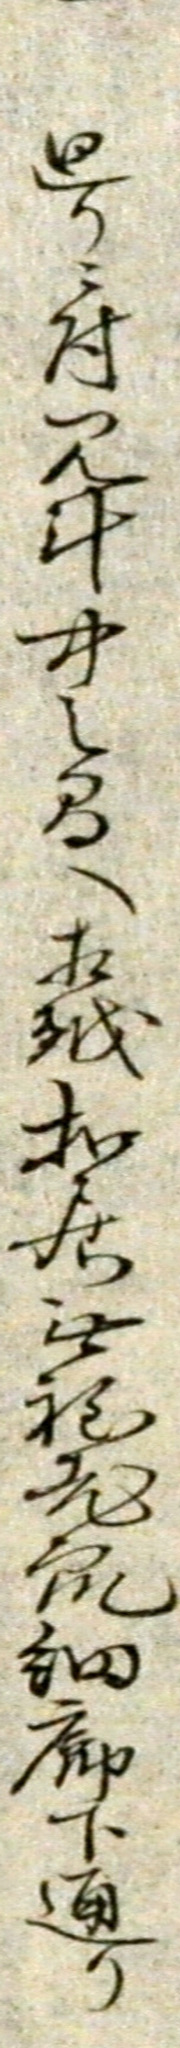一廻りニ付見計中之間へ相越扣居無程老衆細廊下通り
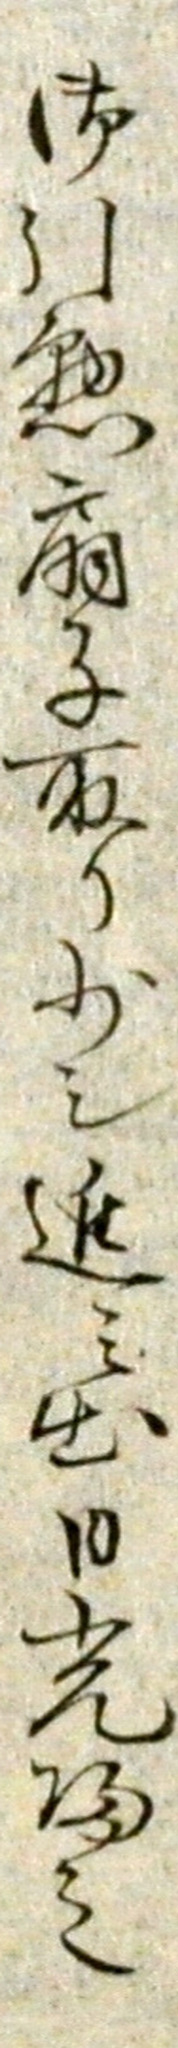御引懸扇子取り少シ進ミ出日光帰之
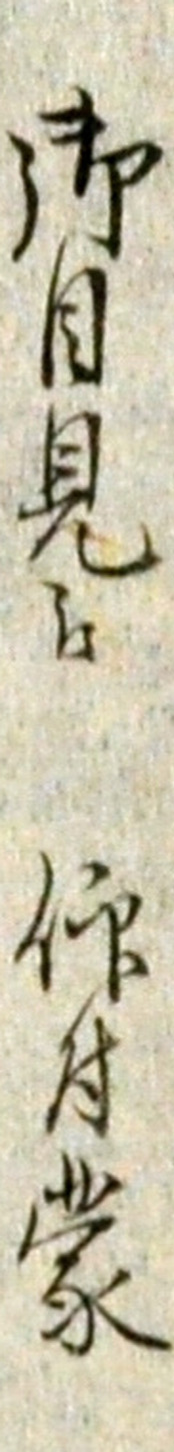御目見被仰付蒙
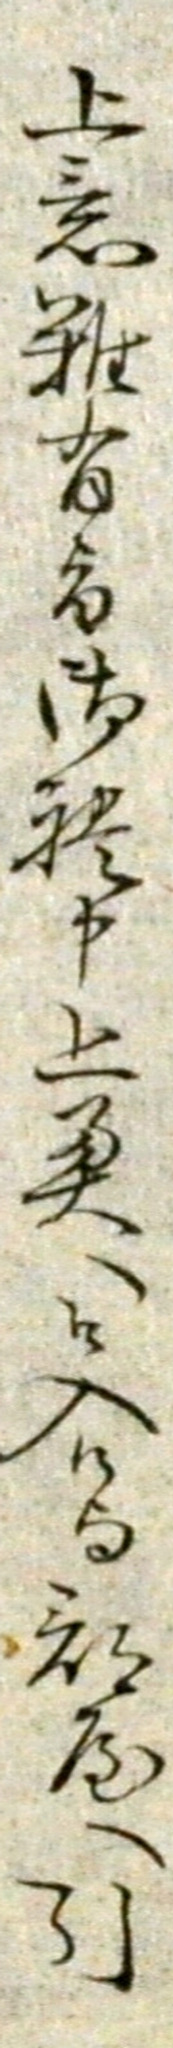上意難有旨御礼申上奥へ被入候と部屋へ引
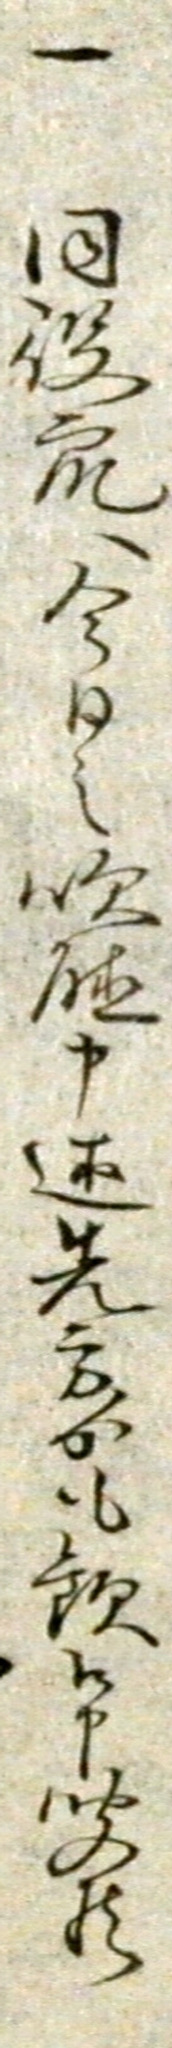一同役衆へ今日之吹聴申述先方ゟも歓被申聞候
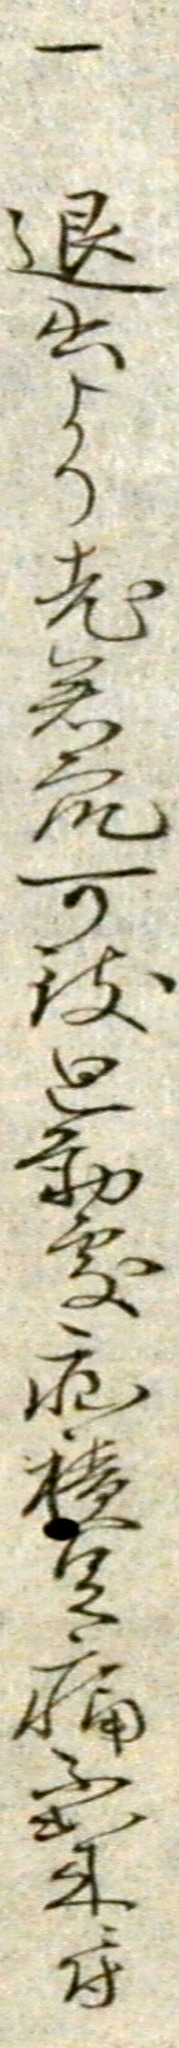一退出より老若衆可致廻勤処疱積足痛等出来ニ付
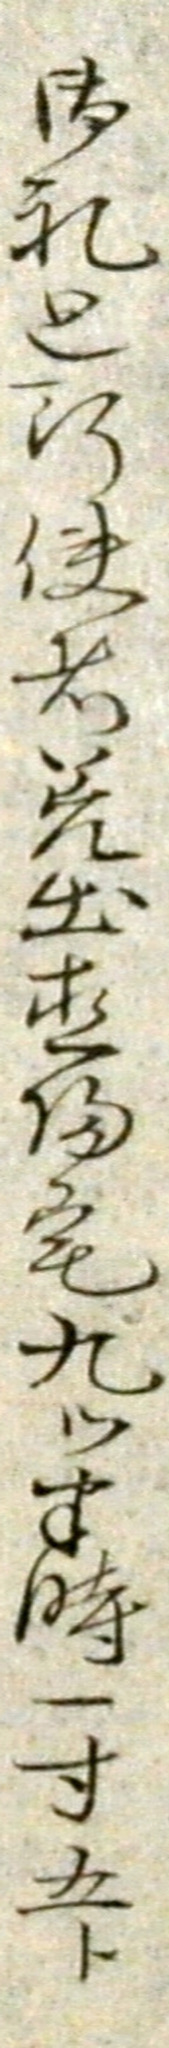御礼廻断御使者差出直帰宅九ツ半時一寸五分

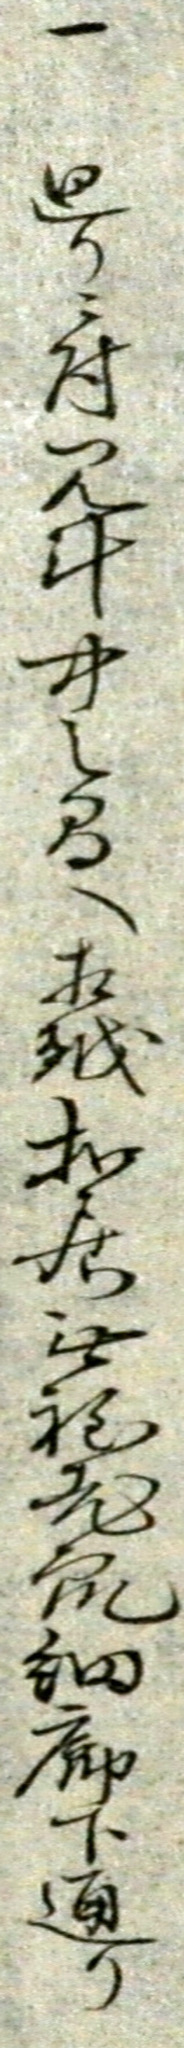一廻り二付見計中之間へ相越扣居り無程老衆細廊下通り
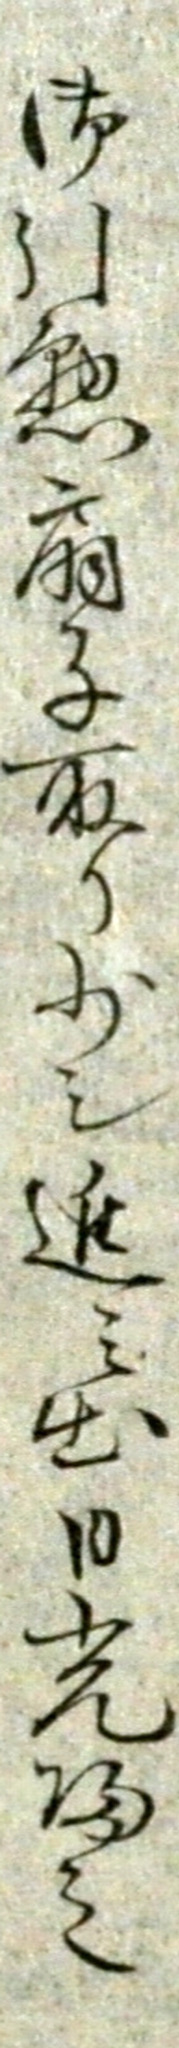御引懸扇子取り少シ進ミ出日光帰之
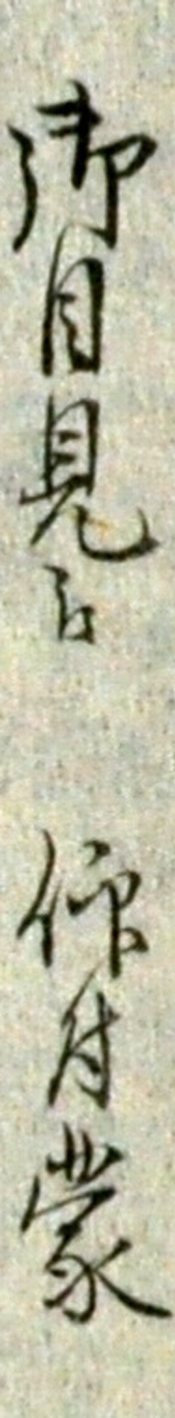御目見被仰付蒙
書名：日光御名代相勤候節ノ留
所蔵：伊那市立高遠町図書館・合同会社AMANE
